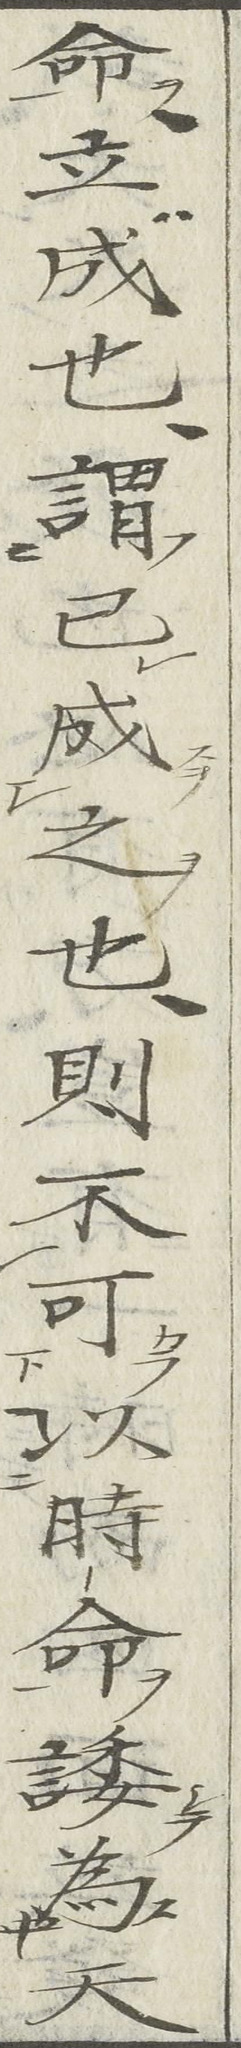命、立成也、謂已成之也、則不可以時命諉為天
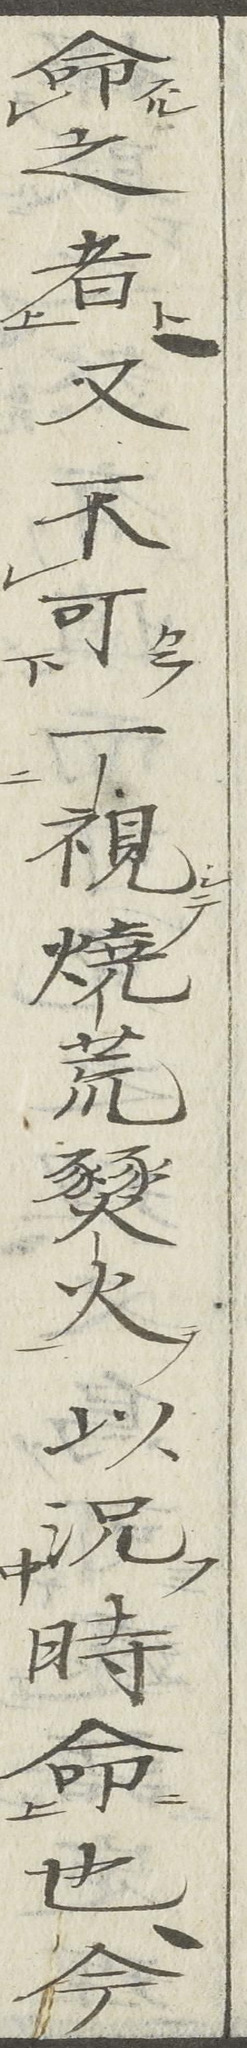命之也、又不可一視焼荒燹火以況時命也、今
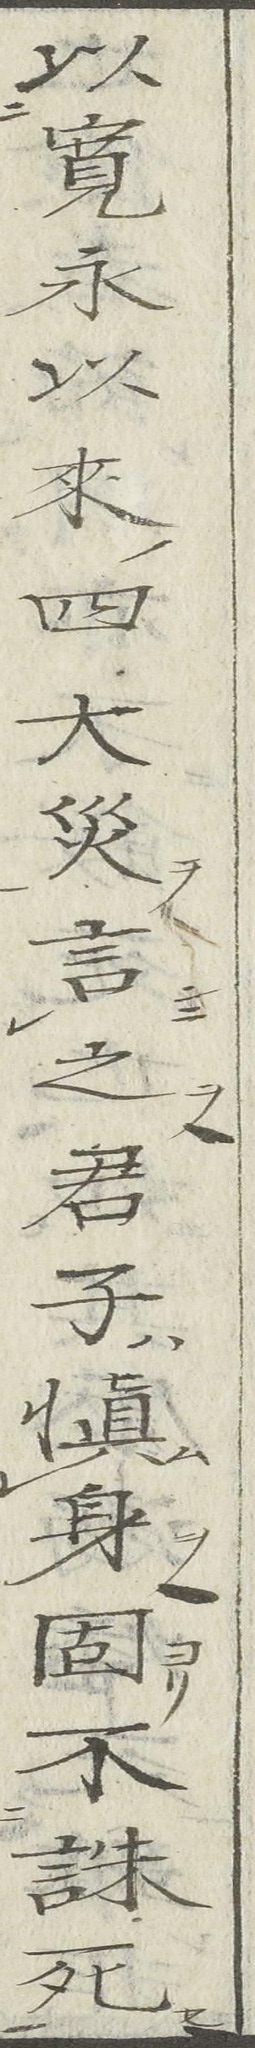以寛永以来四大災害之、君子慎身、固不誅死

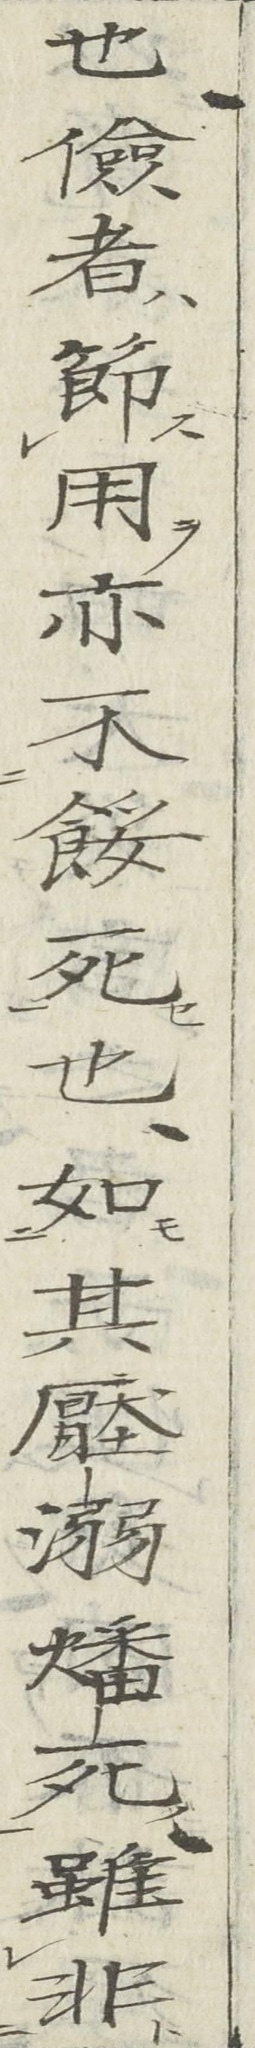也、倹者節用亦不餒死也、如其圧溺燔死、雖非
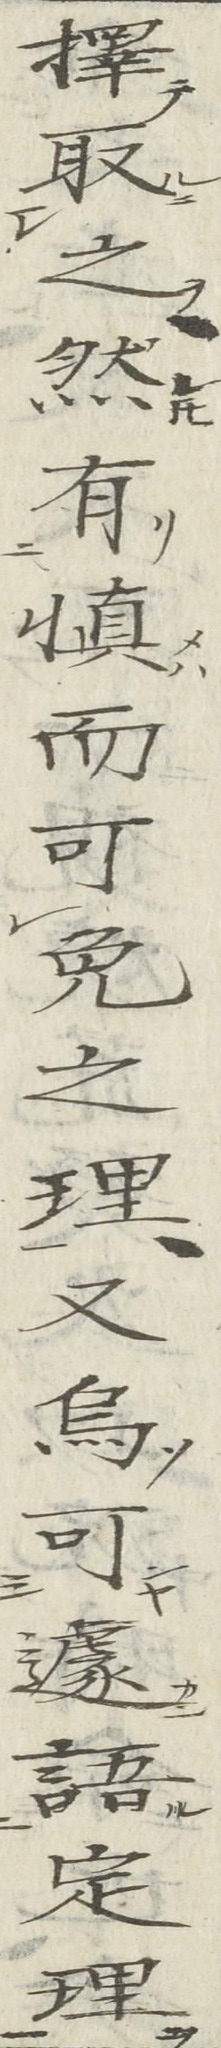択取之、然有慎而可免之理、又烏可遽語定理
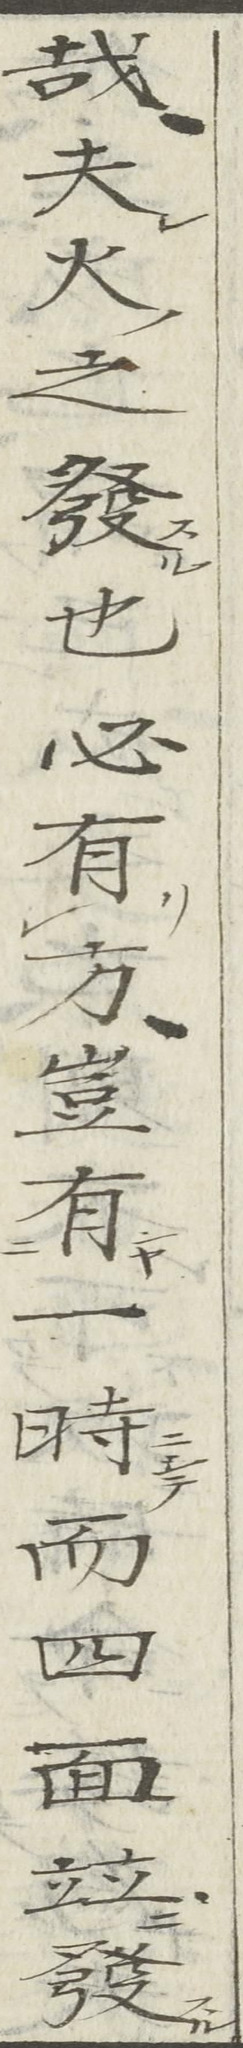哉、夫火之発也必有方、豈有一時而四面並発
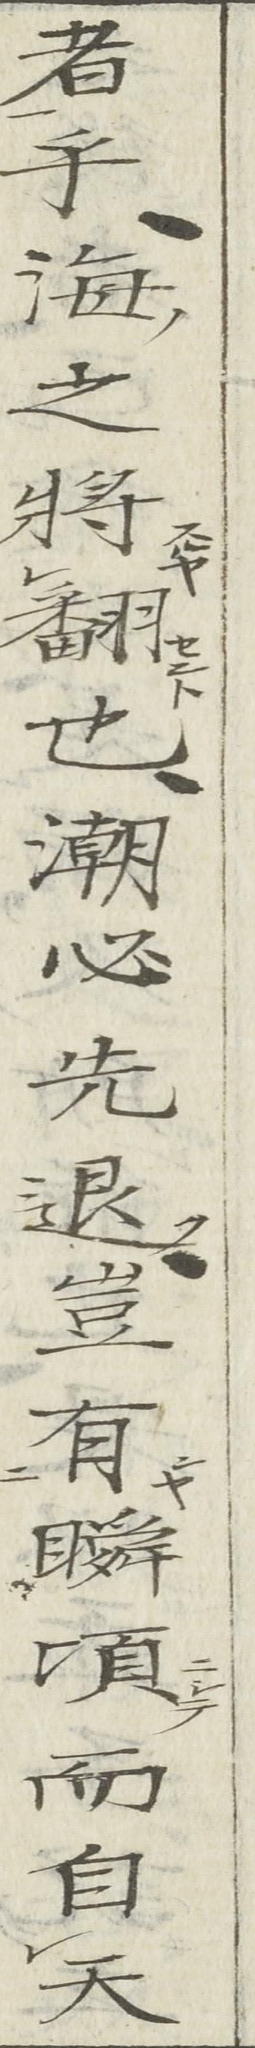者乎、海之将翻也、潮必先退、豈有瞬頃而自天
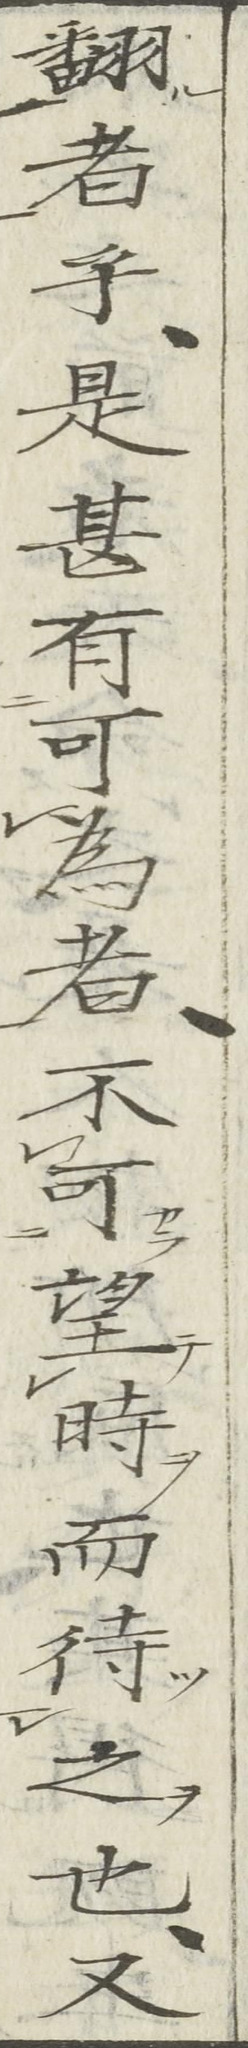翻者乎、是甚有可為者、不可望時而待之也、又
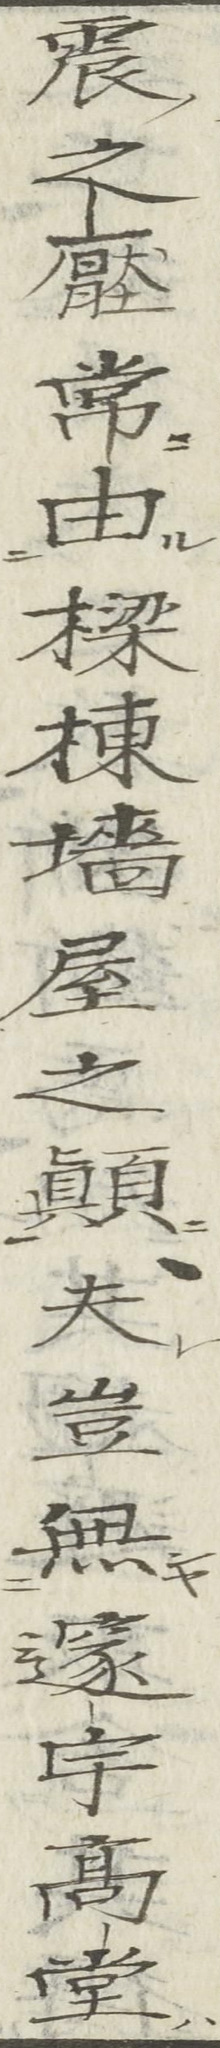震之圧常由樑棟墻屋之顛、夫豈無邃宇高堂
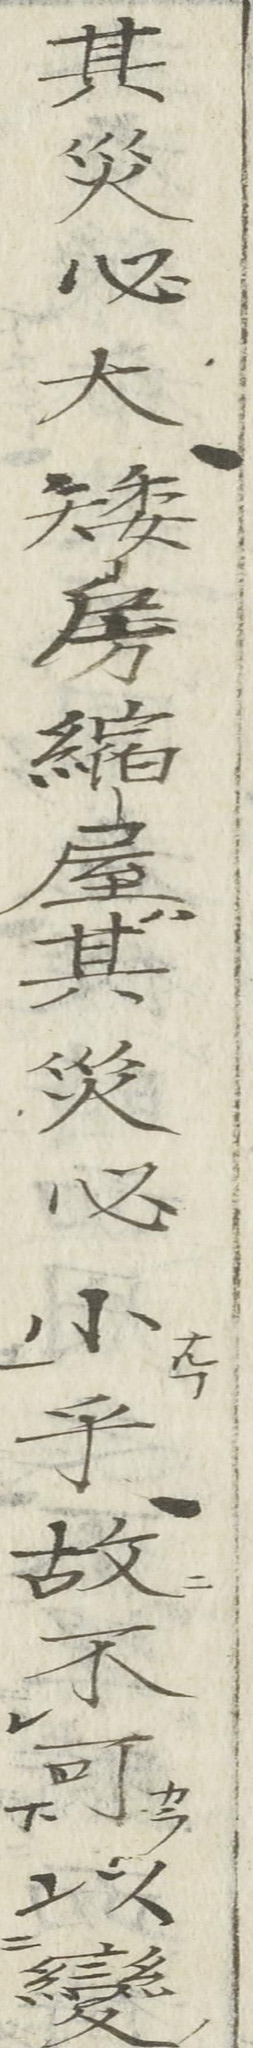其災必大、矮房縮屋其災必小乎、故不可以変
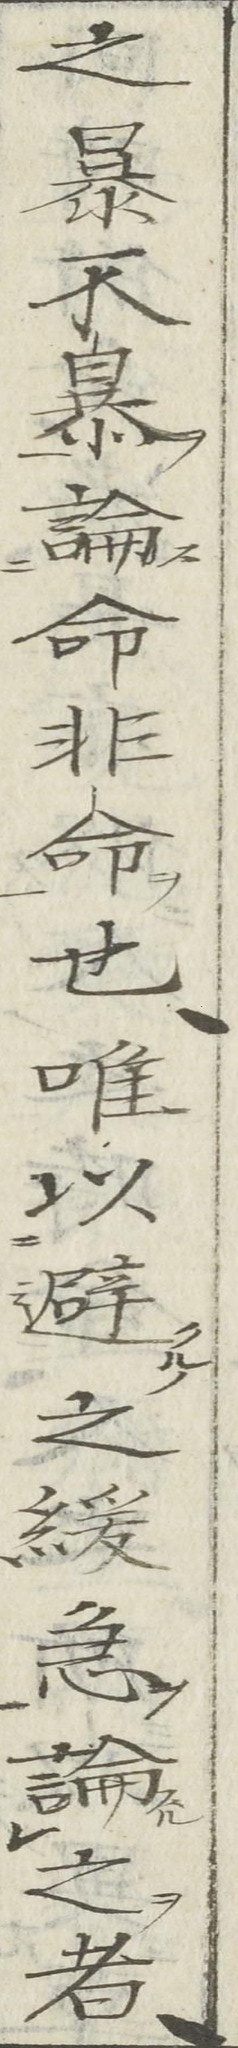之暴不暴論命非命也、唯以避之緩急論之者、
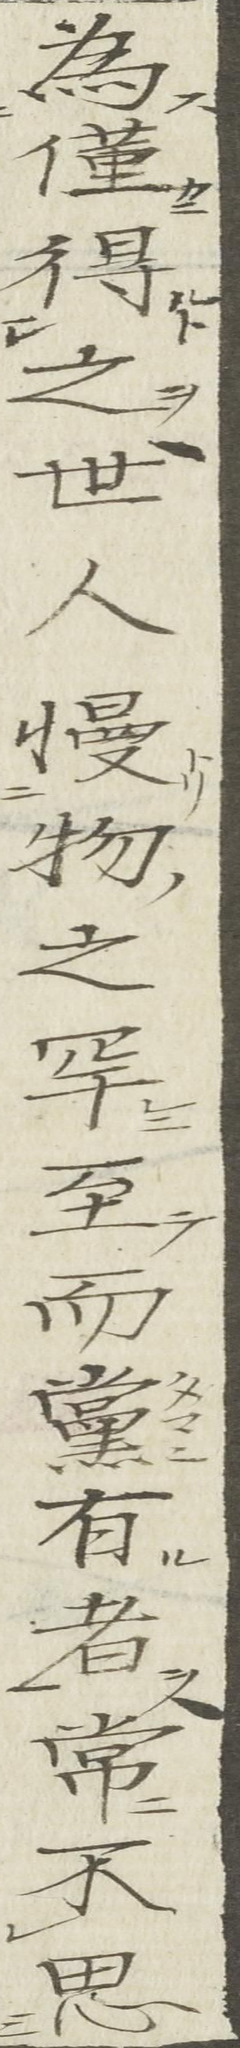為僅得之、世人慢物之罕至而党有者、常不思
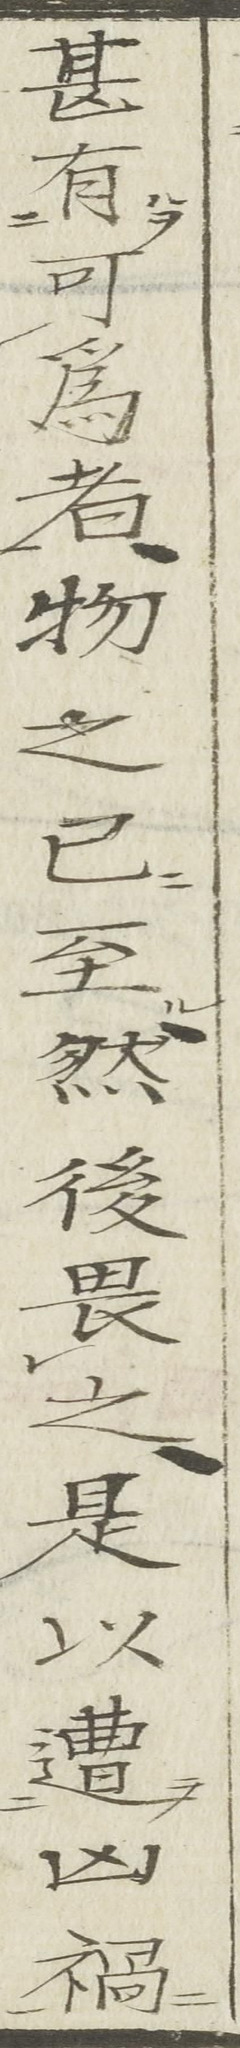甚有可為者、物之已至、然後畏之、是以遭凶禍
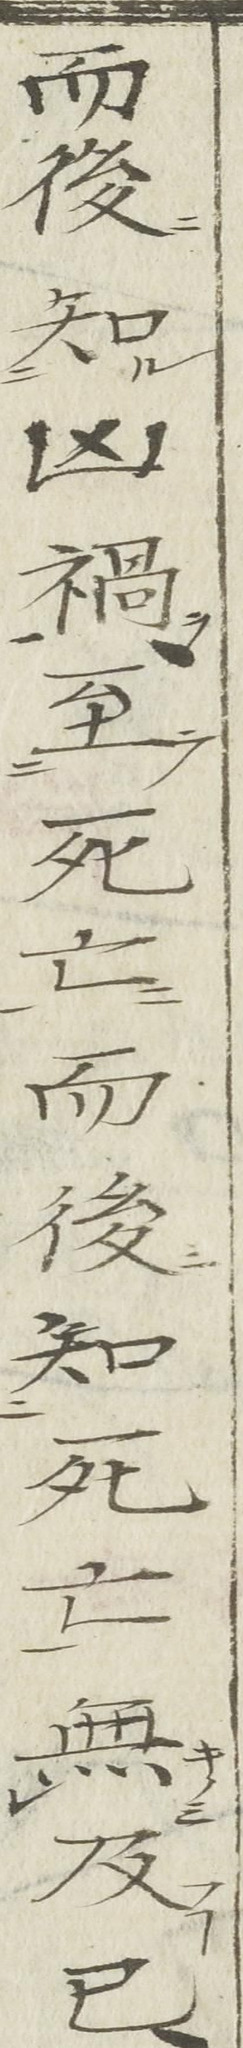而後知凶禍、至死亡而後知死亡無及已、

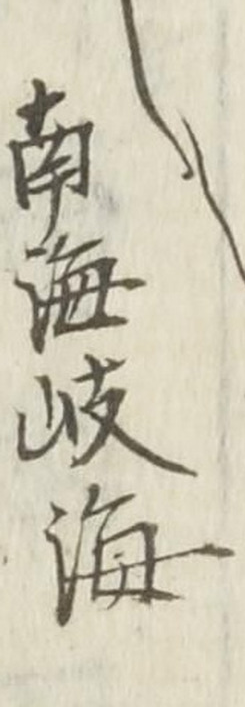南海岐海
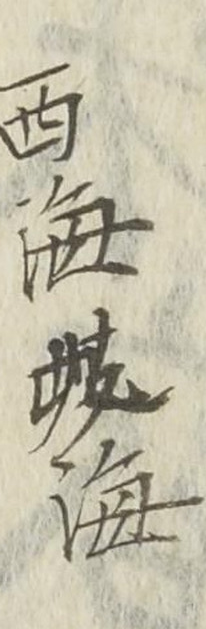西海岐海
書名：海翻考　全
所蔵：東京大学地震研究所図書室 Earthquake Research Institute Library, The University of Tokyo, JAPAN
